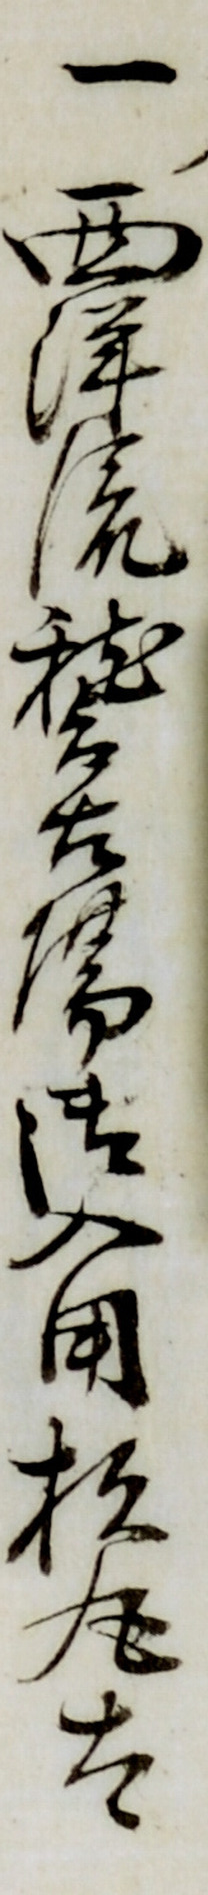一西洋流稽古場御入用杉丸太
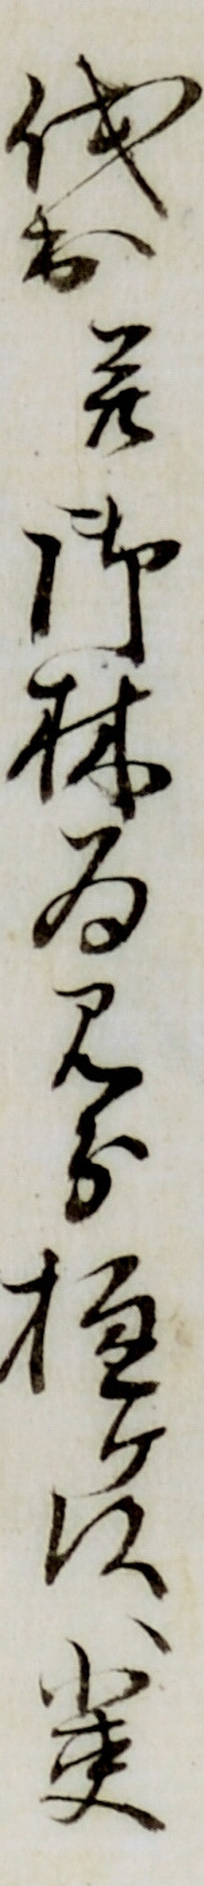伐出幷御林為見分樋ケ沢へ小使
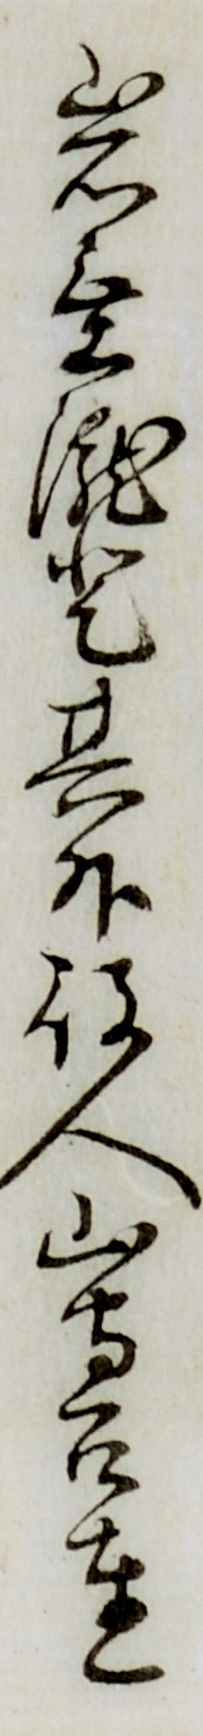岩垂滝登其外役人山守召連
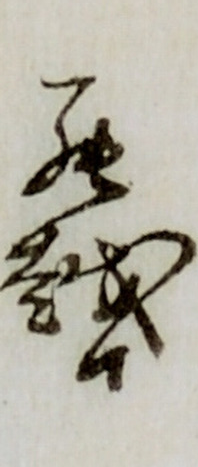罷越候
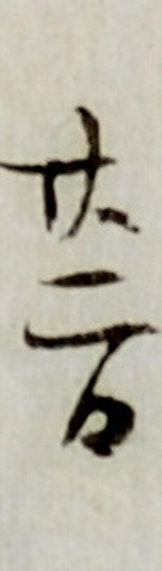廿二日
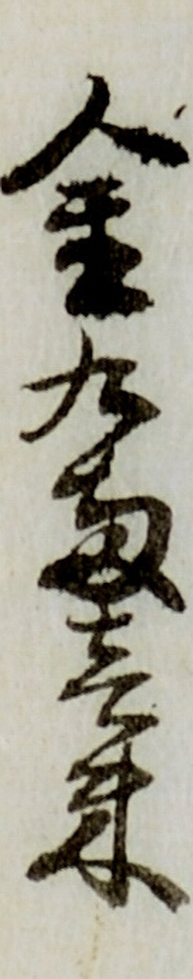金九両壱朱
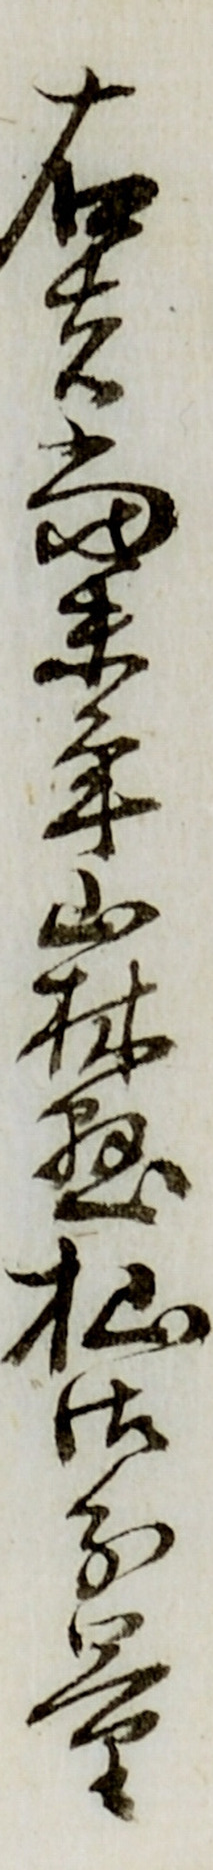右は当未年山林懸杣御分量
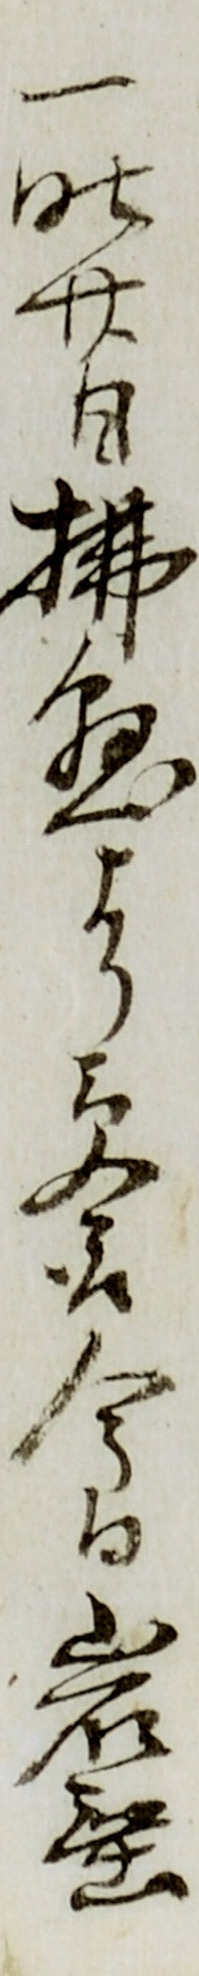一昨廿日払懸より受取今日岩垂
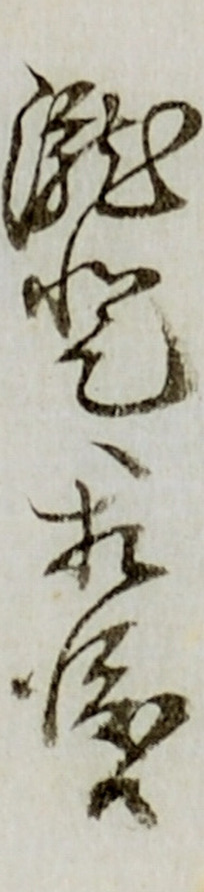滝登へ相渡候
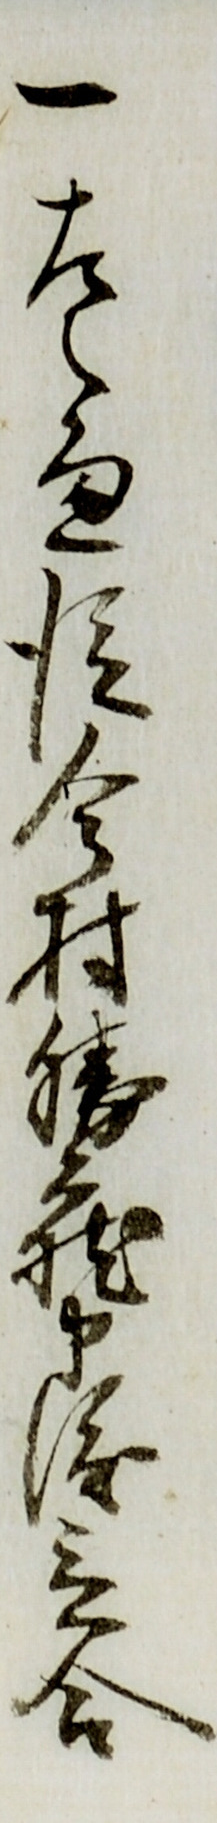一左之通従今村勝蔵申渡立合
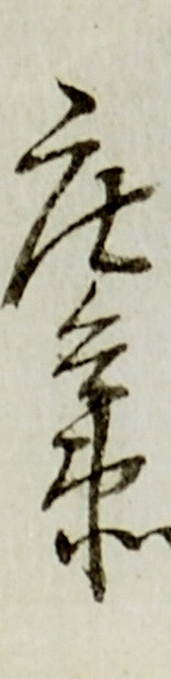庄兵衛
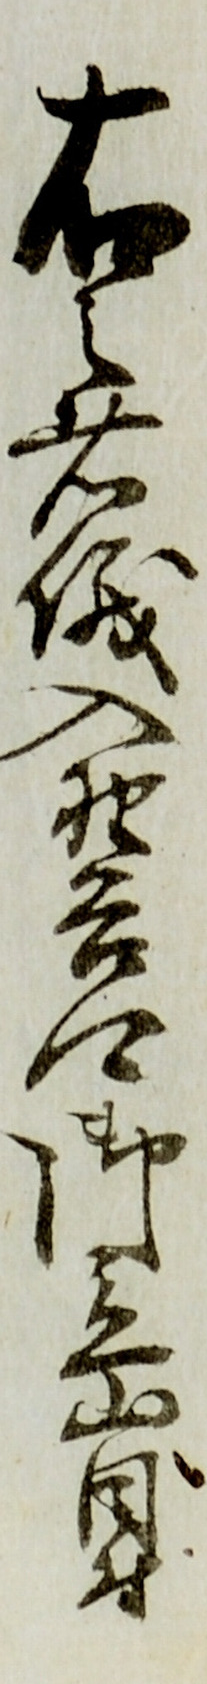右之者儀入野谷郷御立山目付
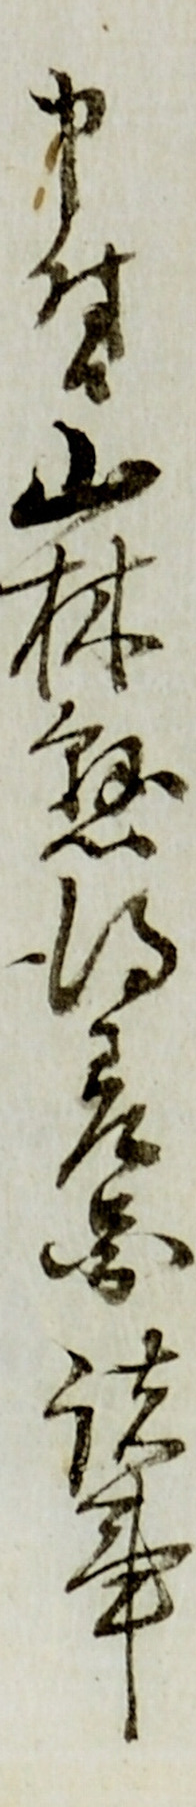申付候山林懸得差図諸事
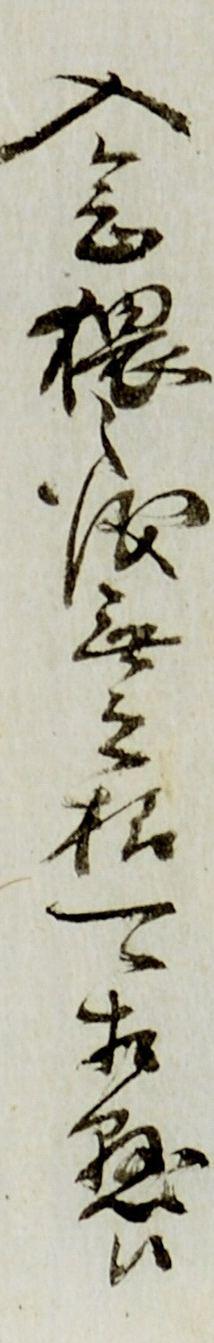入念猥之儀無之様可相懸候
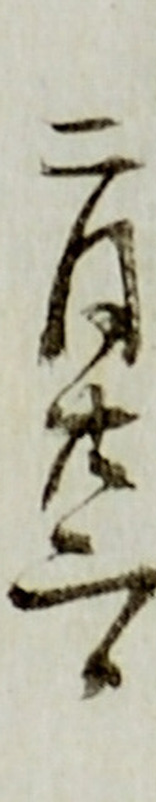二月廿二日
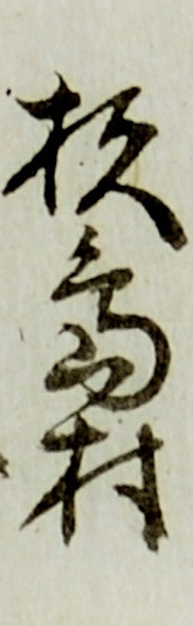杉島村
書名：山林方諸事御用留
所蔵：伊那市立高遠町図書館・合同会社AMANE
